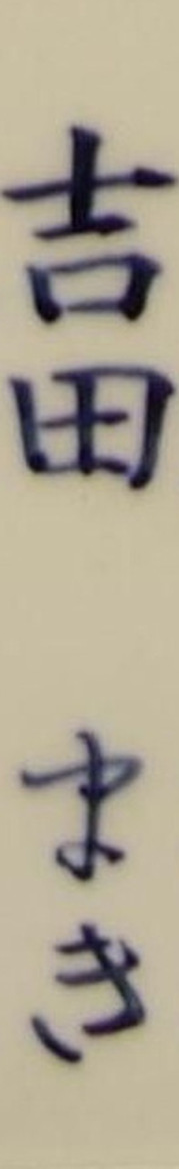吉田まき
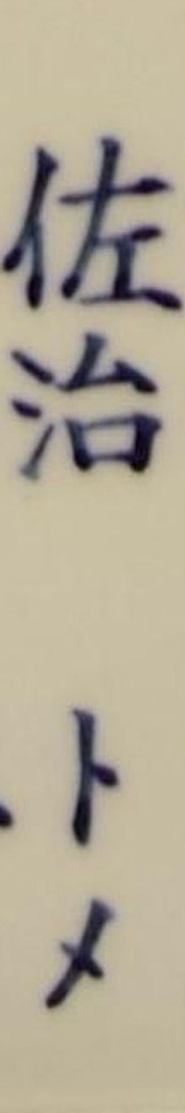佐治トメ
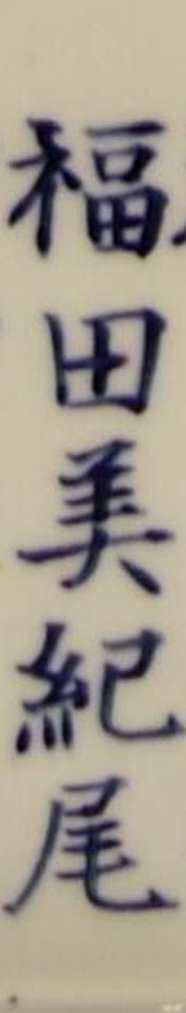福田美紀尾
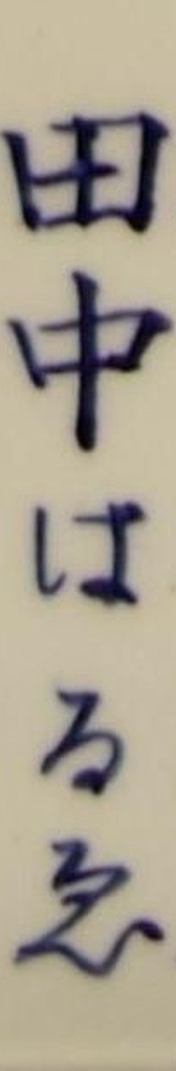田中はるゑ
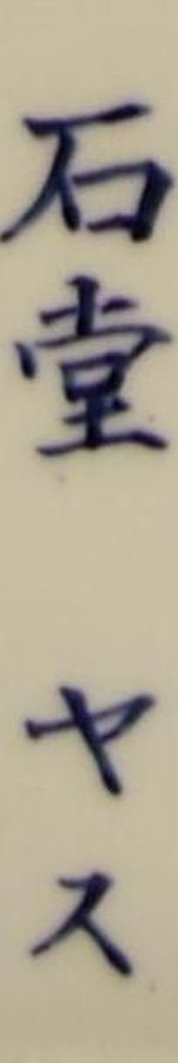石堂ヤス
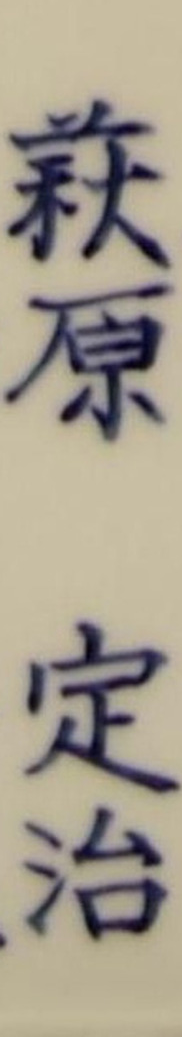萩原定治
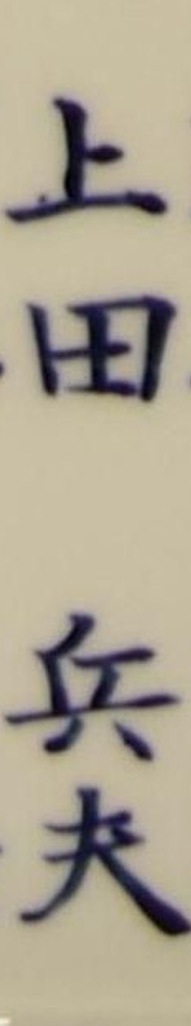上田兵夫
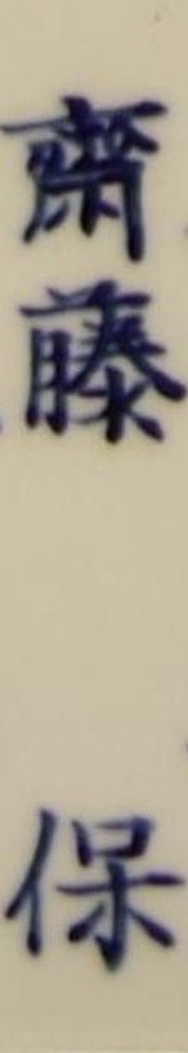齋藤保
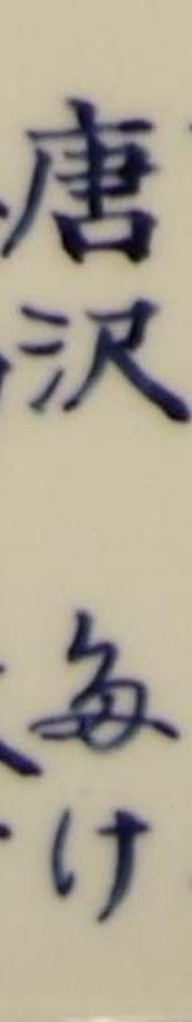唐沢たけ
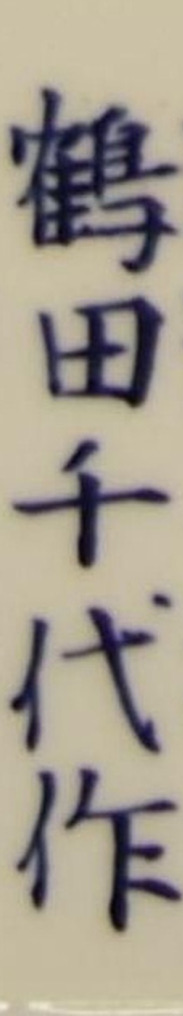鶴田千代作
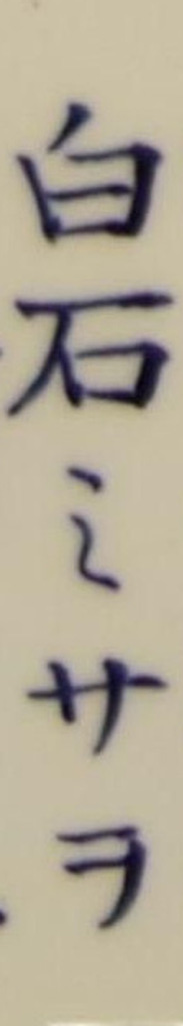白石ミサヲ
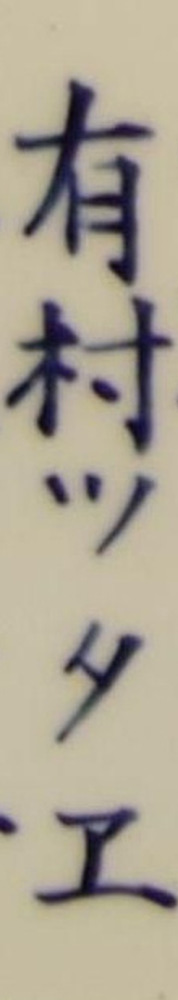有村ツタヱ
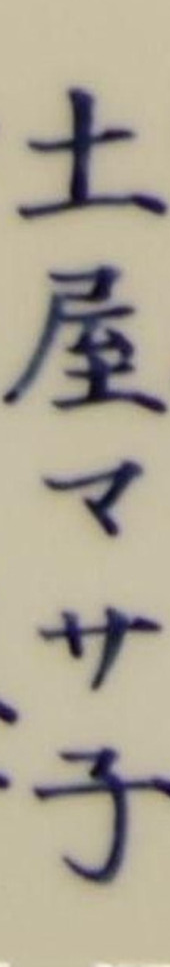土屋マサ子
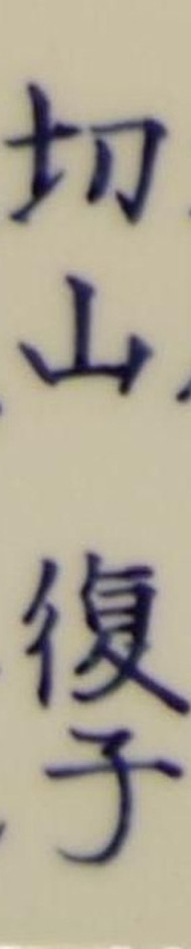切山復子
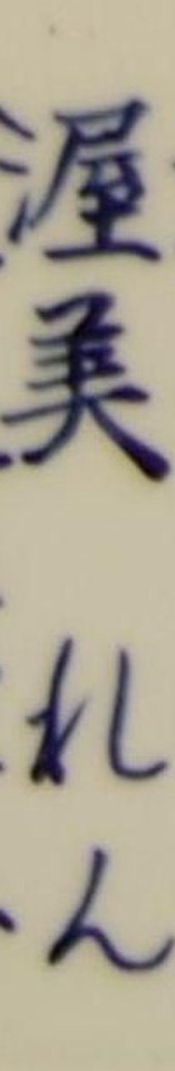屋美れん
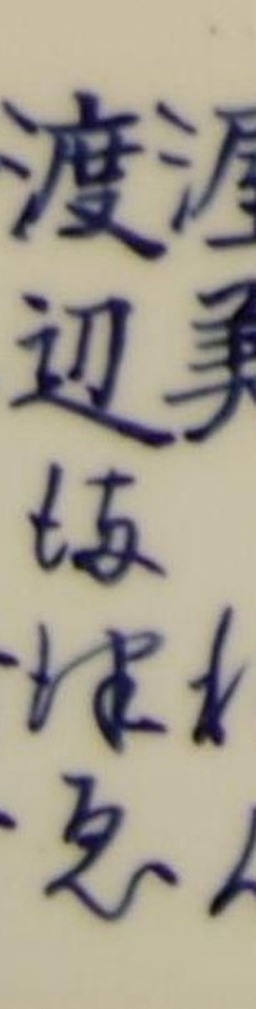渡辺ま津ゑ
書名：A~D
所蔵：koyasan kongobuji
